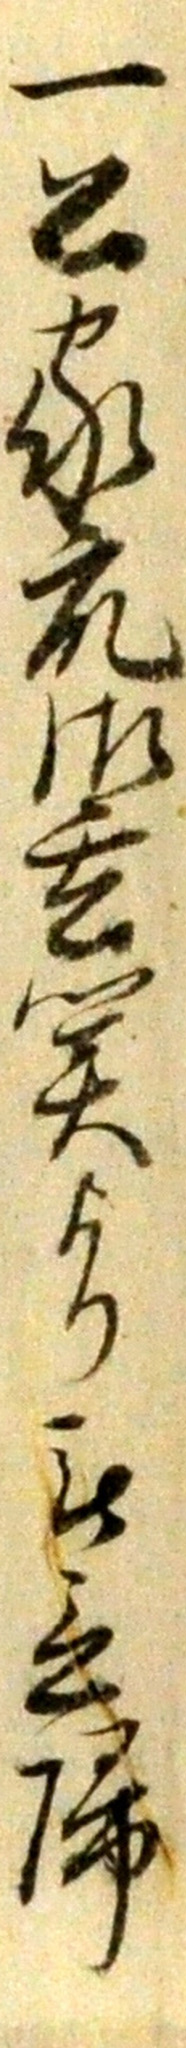一公家衆御玄関より被立帰
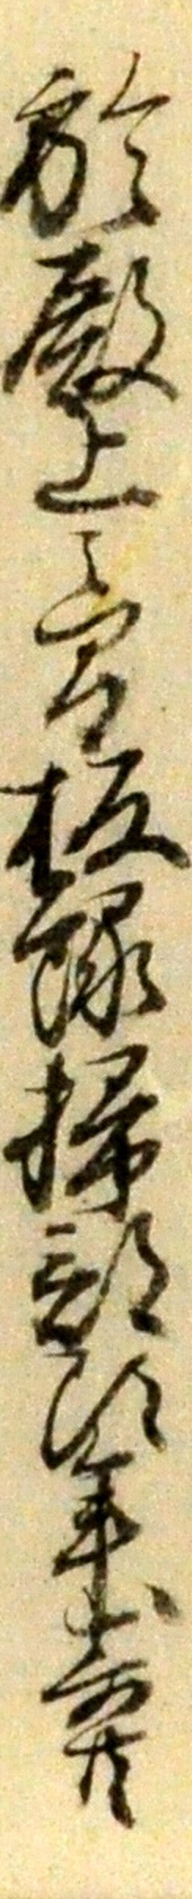於殿上之間板縁掃部頭年寄共
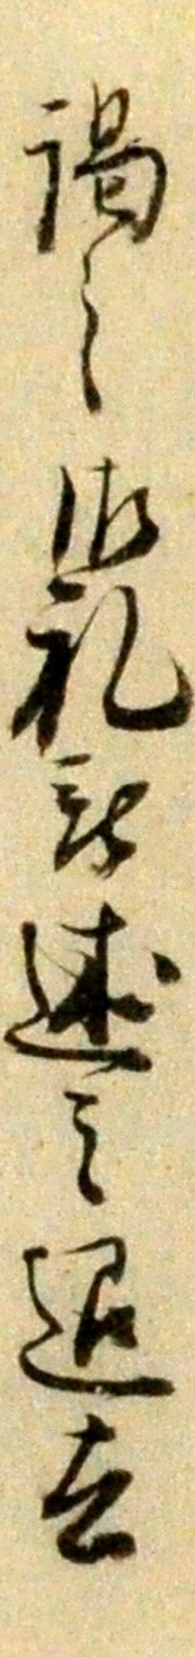謁之御礼被述之退去
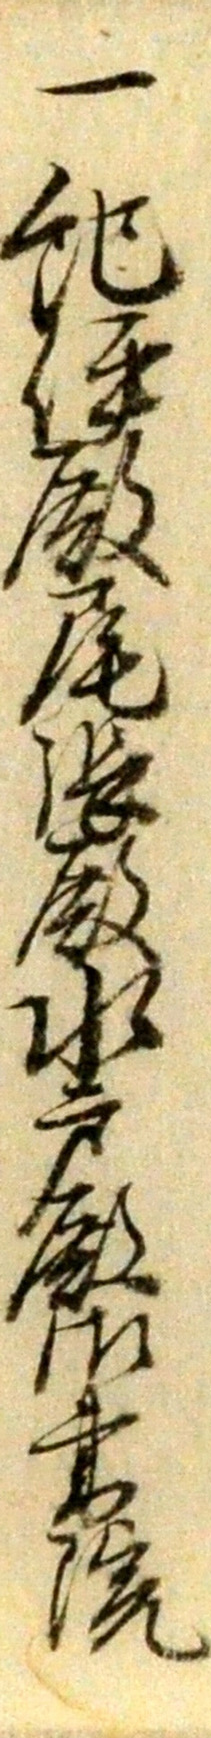一紀伊殿尾張殿水戸殿御書院
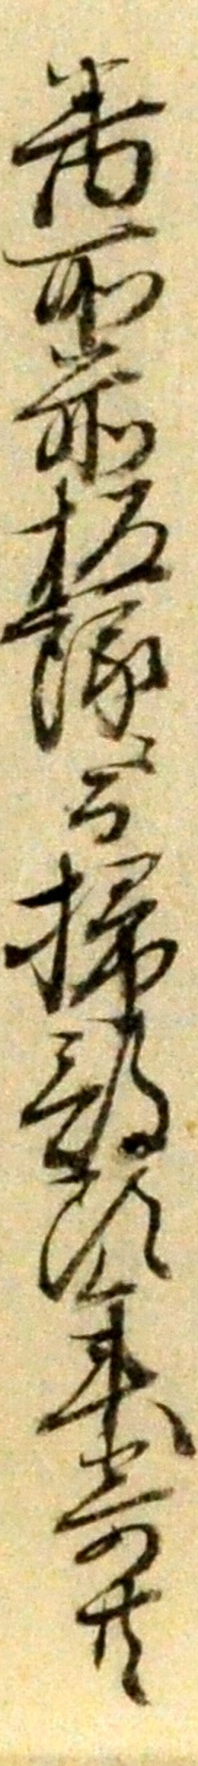番所前板縁ニ而掃部頭年寄共
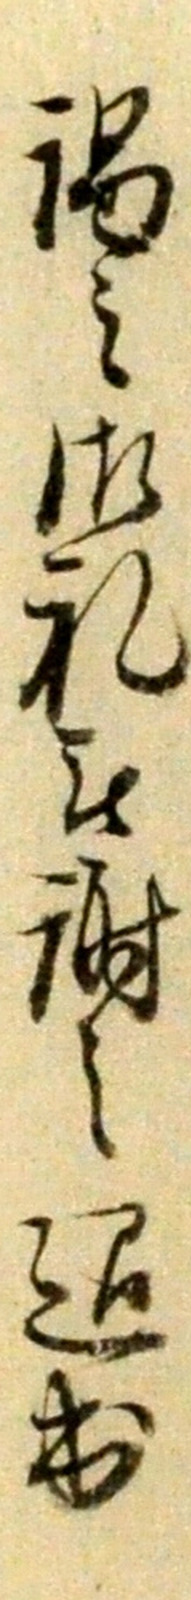謁之御礼被謝之退出
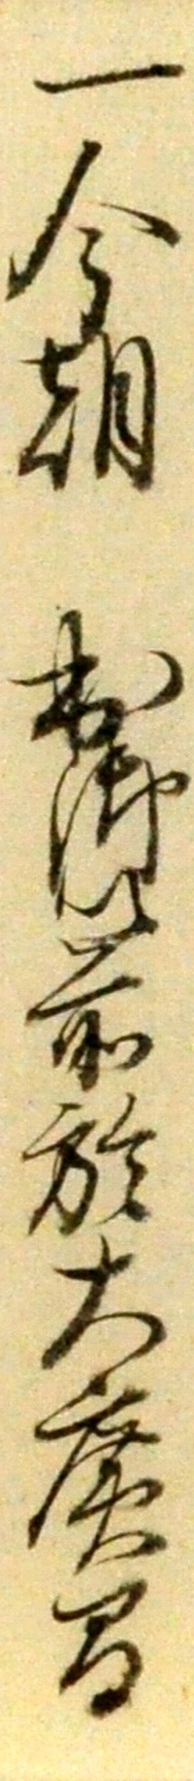一今朝出御以前於大広間

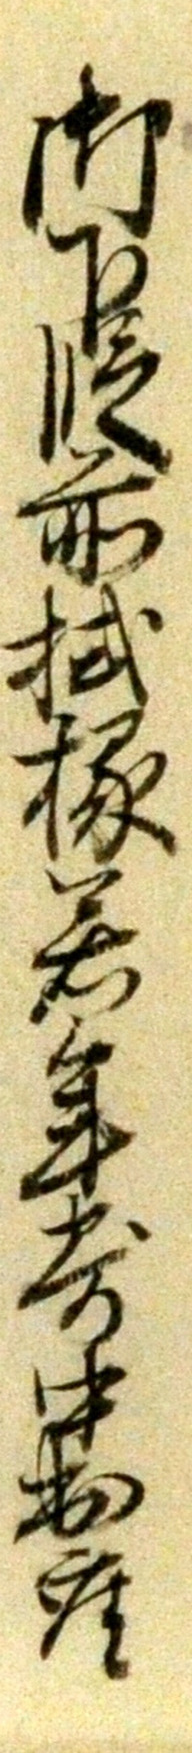御下段前拭椽若年寄中出座
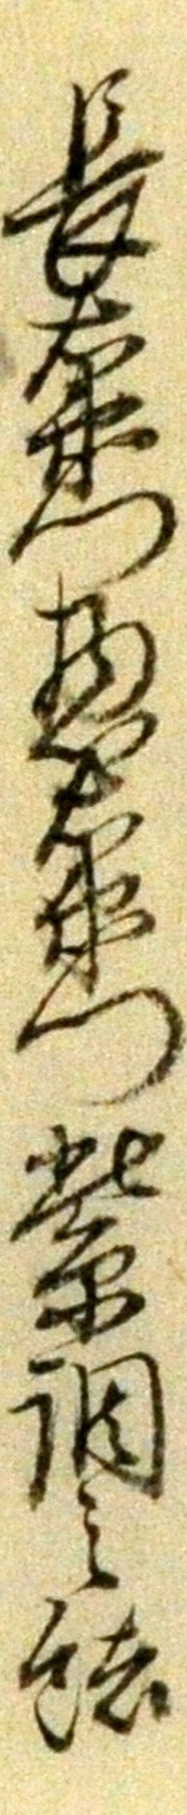長右衛門惣右衛門紫調之緒
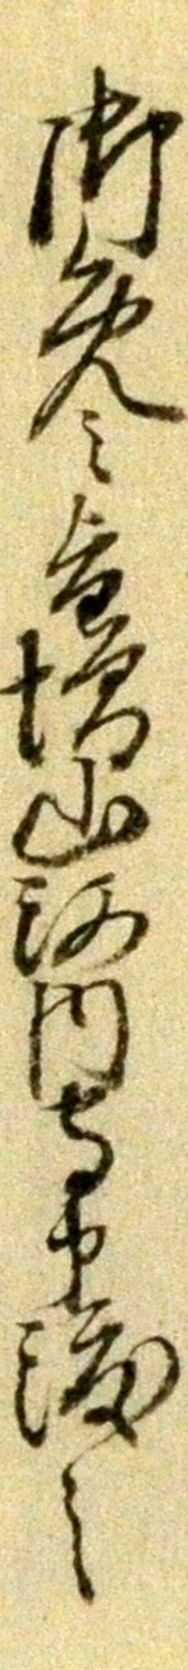御免之旨増山河内守申渡之
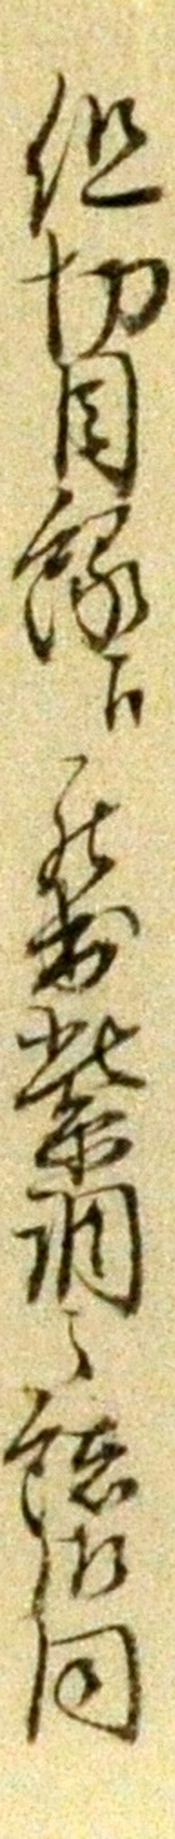但切目縁え罷出紫調之緒御同
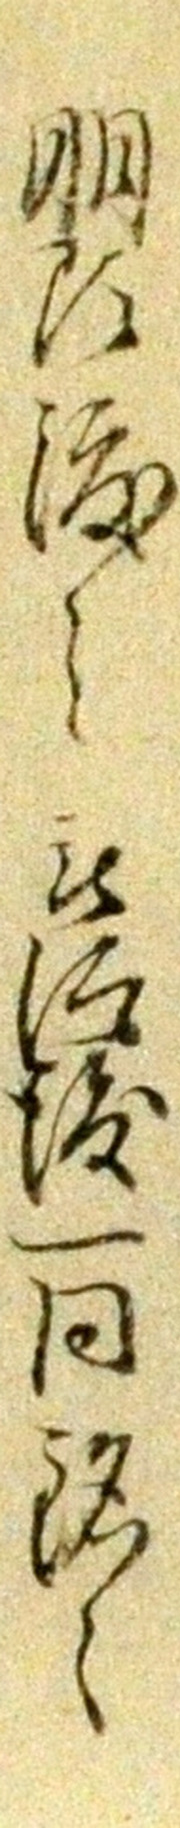朋頭渡之被仰渡一同銘々
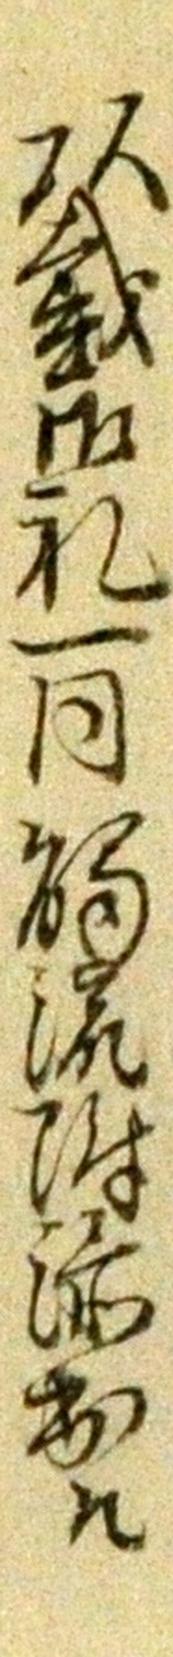頂戴御礼一同触流附添出ル
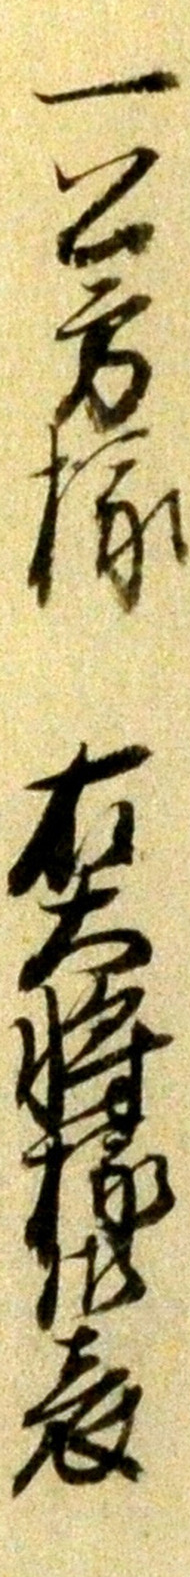一公方様右大将様御表
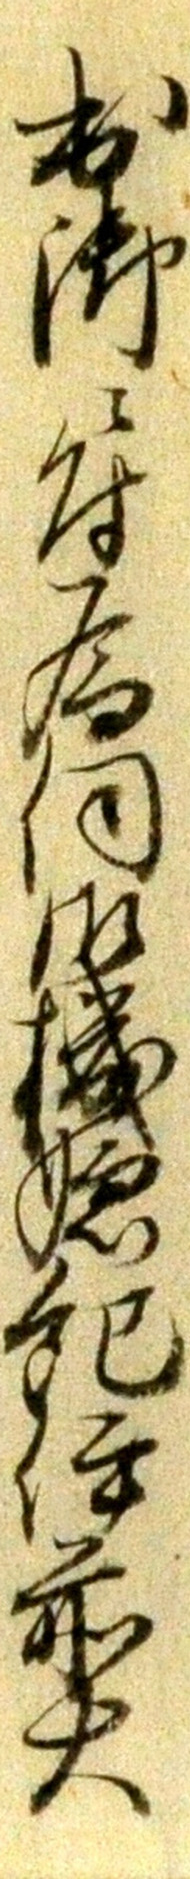出御ニ付為伺御機嫌紀伊前大
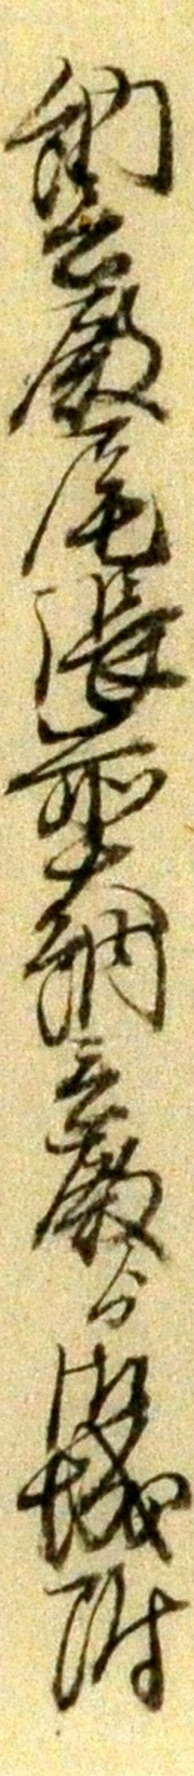納言殿尾張前大納言殿ゟ御城附
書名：御馳走御能ノ節ノ留外
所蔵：伊那市立高遠町図書館・合同会社AMANE
